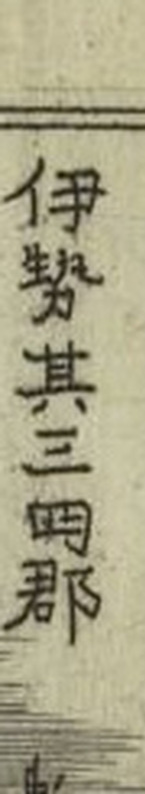伊勢其三四郡

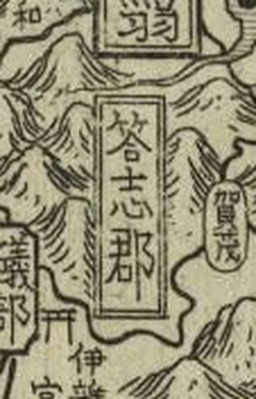答志郡

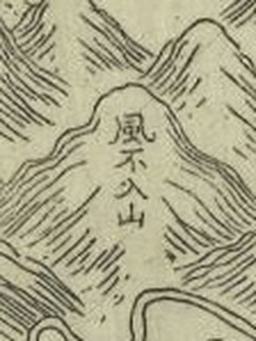風不入山
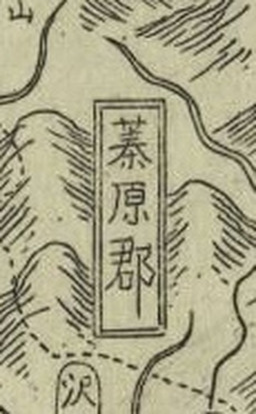蓁原郡
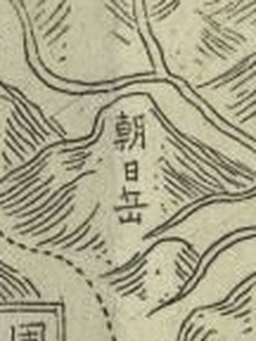朝日岳
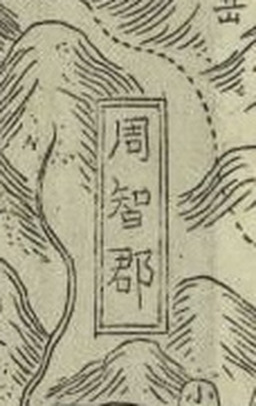周智郡
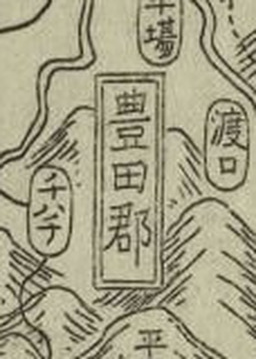豊田郡
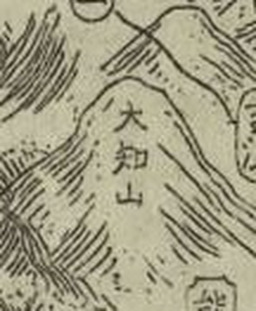大知山

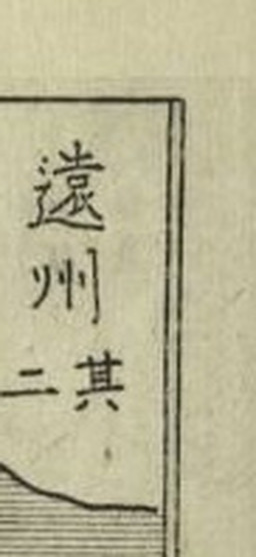遠州其
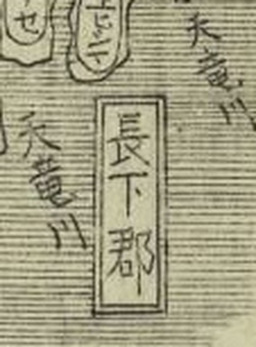長下郡
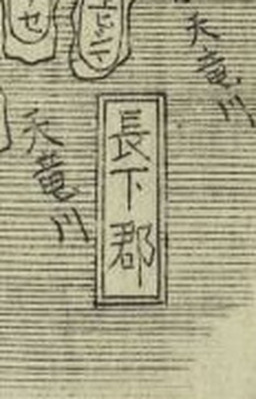長下郡
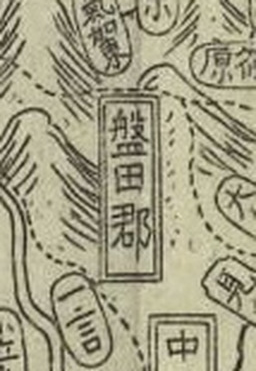盤田郡
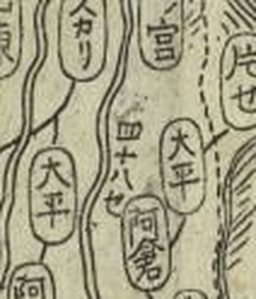四十八せ
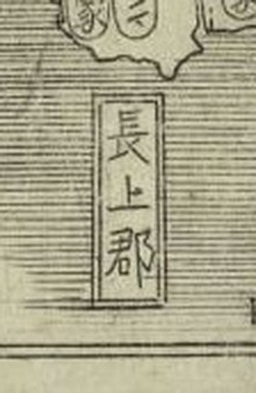長上郡
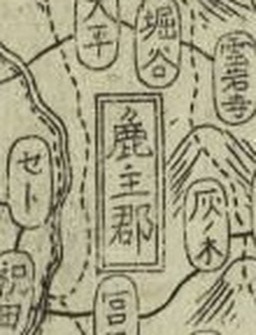麁主郡
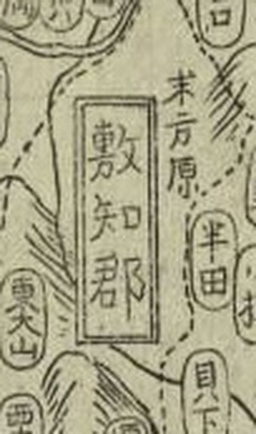敷知郡
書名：大日本国細図 東国之部 上
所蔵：University of the Ryukyus Library
